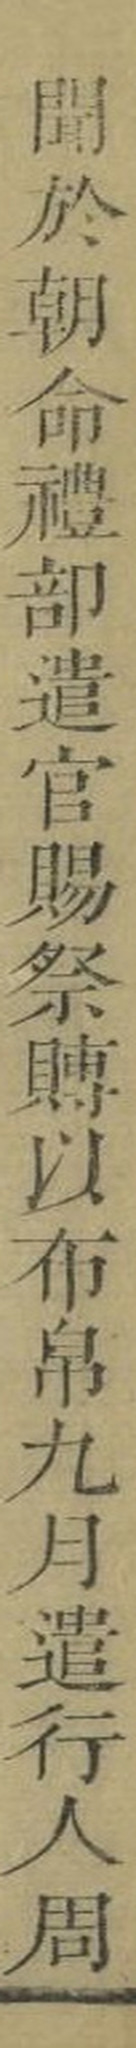聞於朝命礼部遣官賜祭賻以布帛九月遣行人周
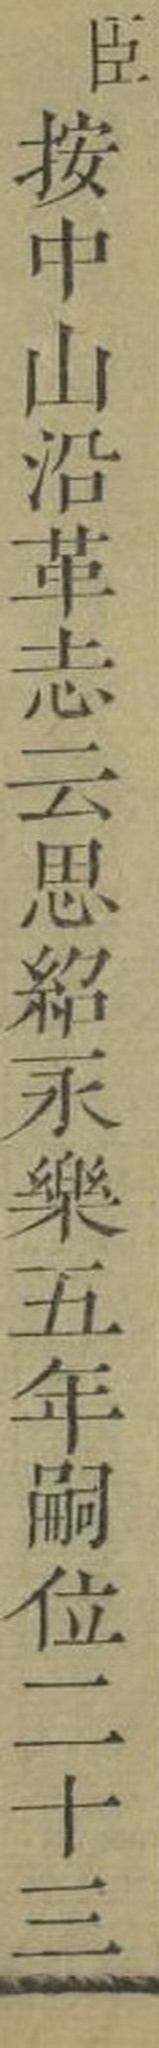臣按中山沿革志云思紹永楽五年嗣位二十三
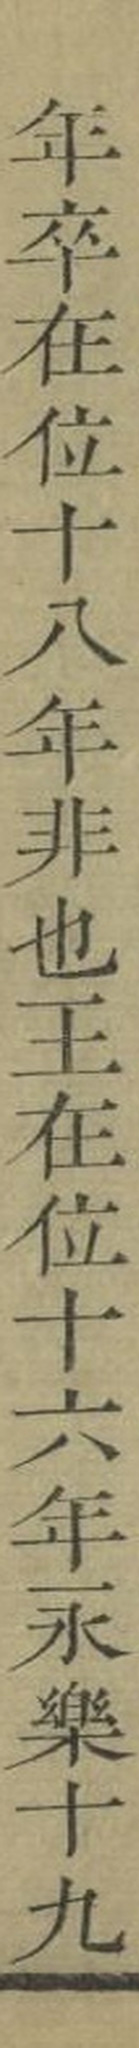年卒在位十八年非也王在位十六年永楽十九
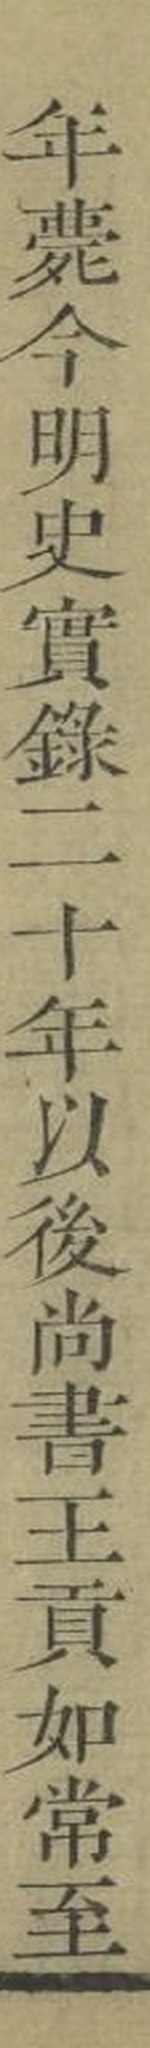年薨今明史実録二十年以後尚書王貢如常至
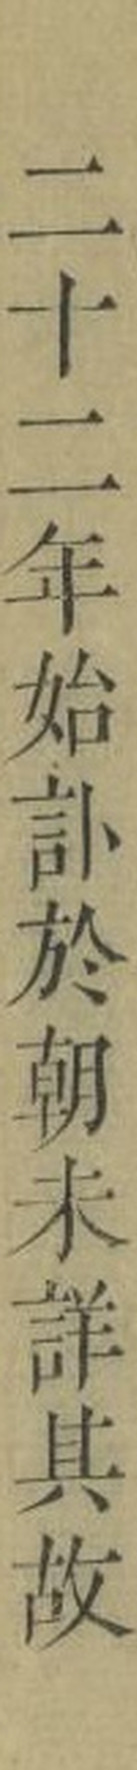二十二年始訃於朝未詳其故
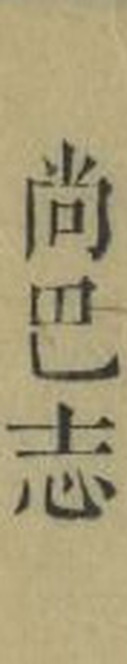尚巴志
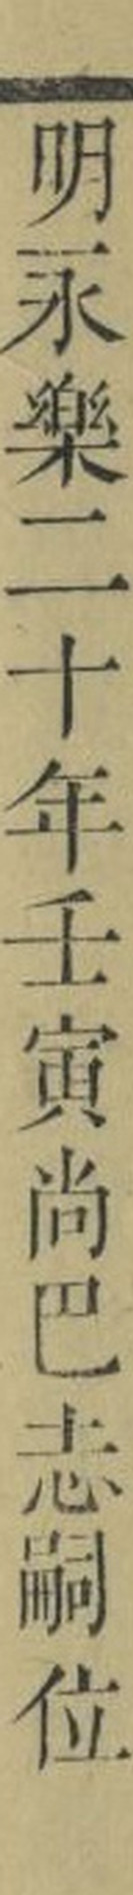明永楽二十年壬寅尚巴志嗣位
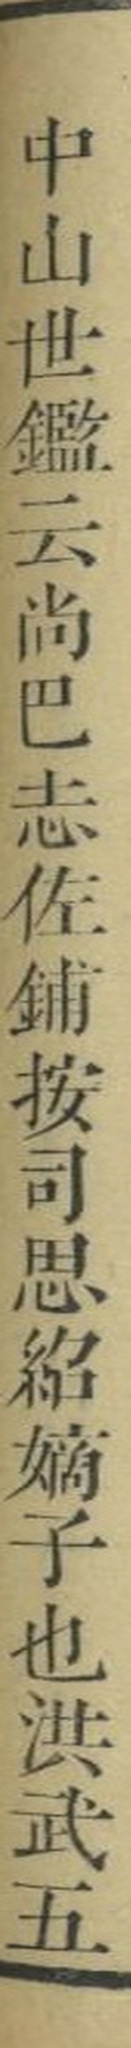中山世鑑云尚巴志佐鋪按司思紹嫡子也洪武五
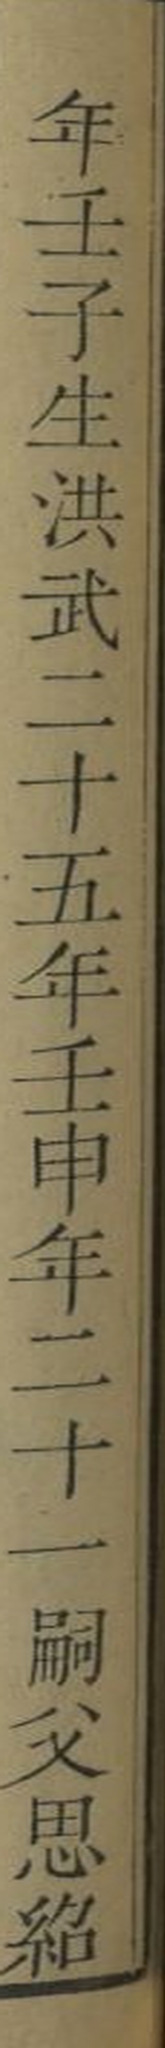年壬子生洪武二十五年壬申年二十一嗣父思紹
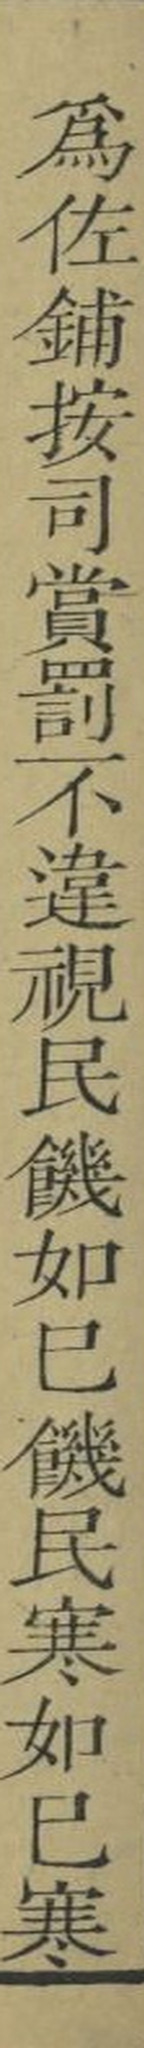為佐鋪按司賞罰不違視民饑如巳饑民寒如巳寒
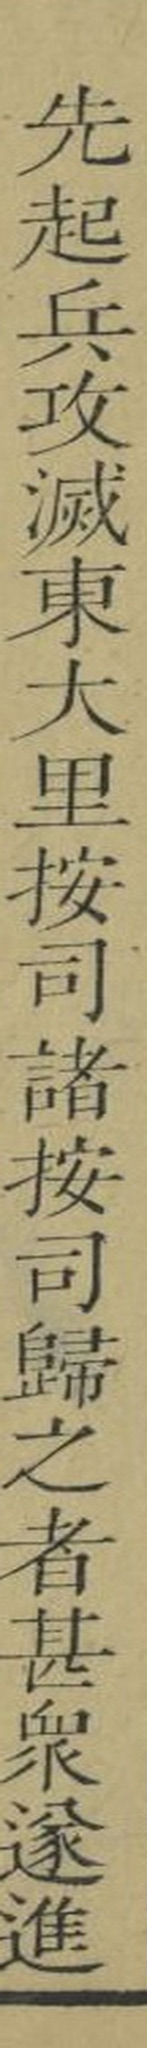先起兵攻滅東大里按司諸按司帰之者甚衆遂進
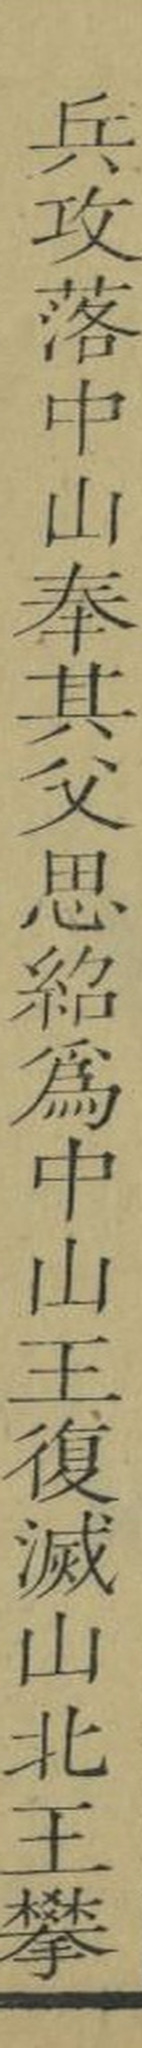兵攻落中山奉其父思紹為中山王復滅山北王攀
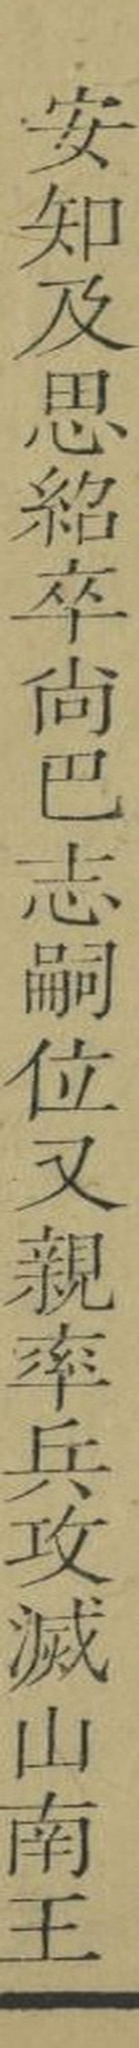安知及思紹卒尚巴志嗣位又親率兵攻滅山南王
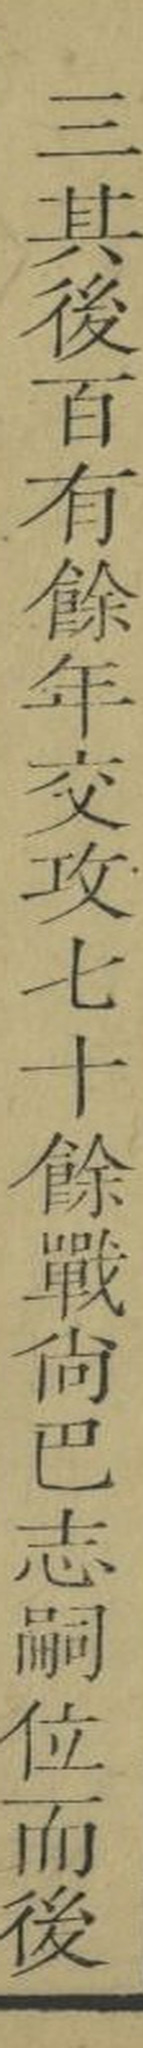三其後百有余年交攻七十余戦尚巴志嗣位而後
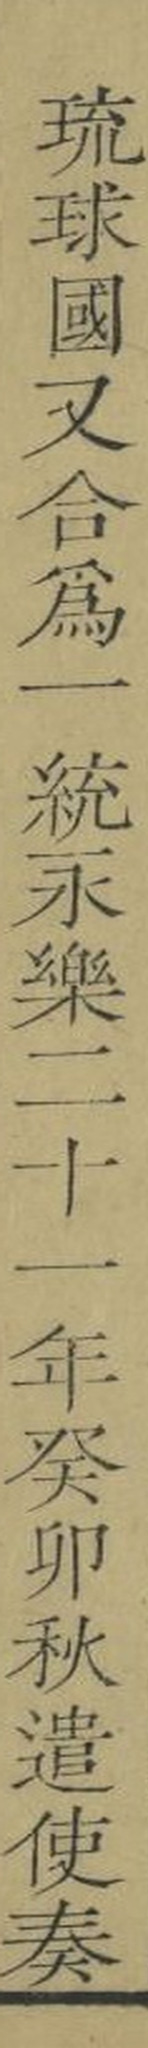琉球国又合為一統永楽二十一年癸卯秋遣使奏
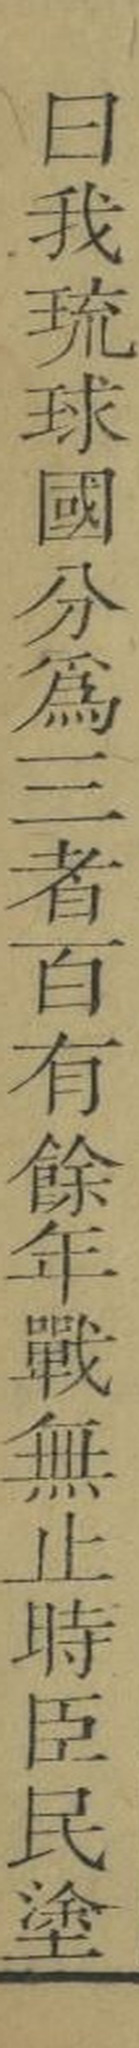曰我琉球国分為三者百有余年戦無止時臣民塗
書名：中山伝信録 巻三
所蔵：University of the Ryukyus Library
